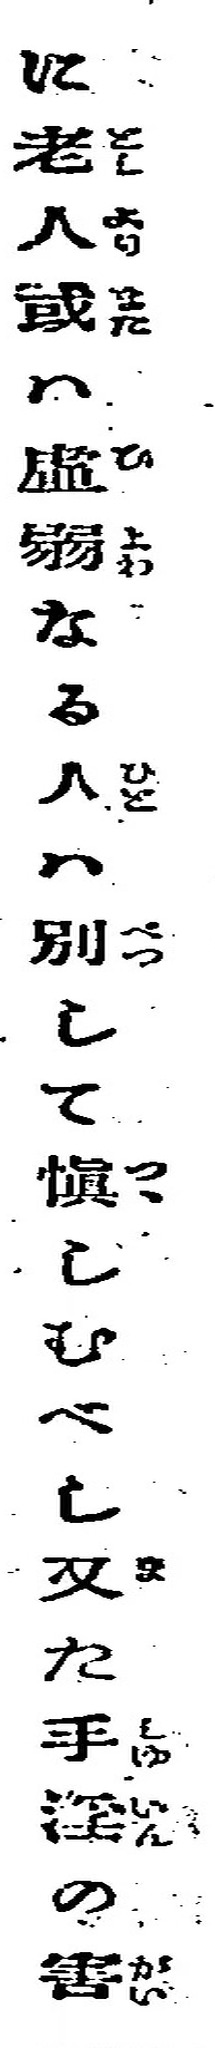に老人或は虚弱なる人は別して慎しむべし又た手淫の害
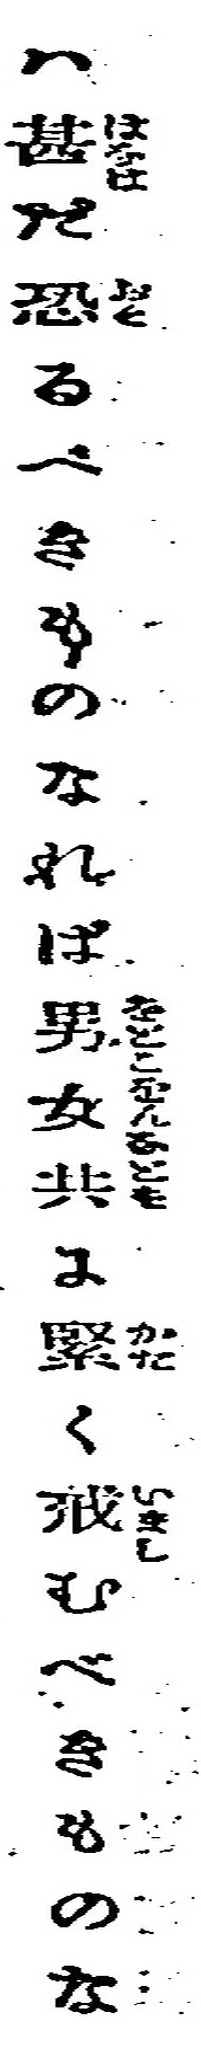は甚だ恐るべきものなれば男女共に緊く戒ぶべきものな
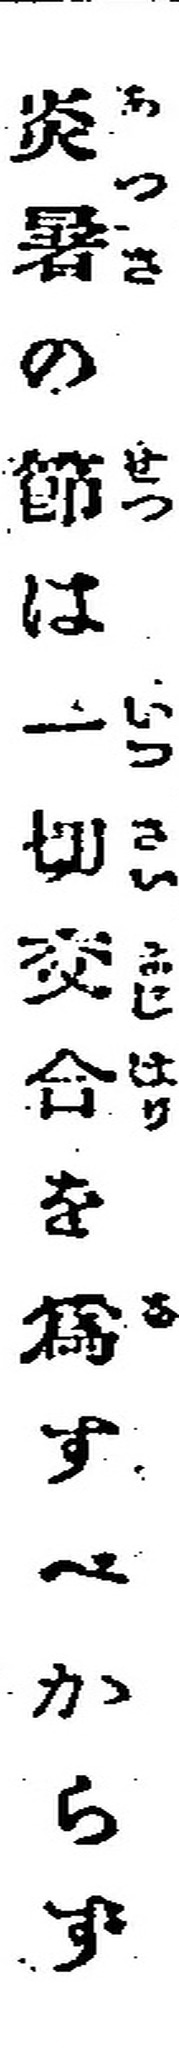炎暑の節は一切交合を為すべからず
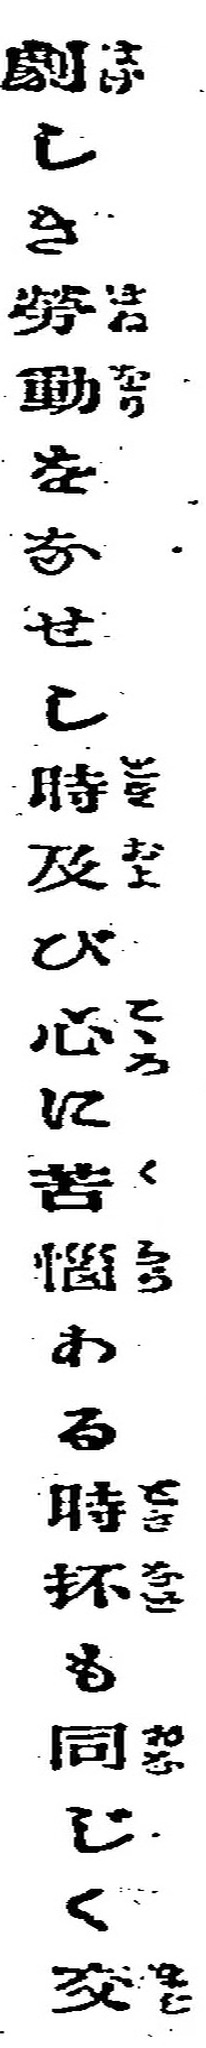劇しき労働をなせし時及び心に苦悩ある時抔も同じく交
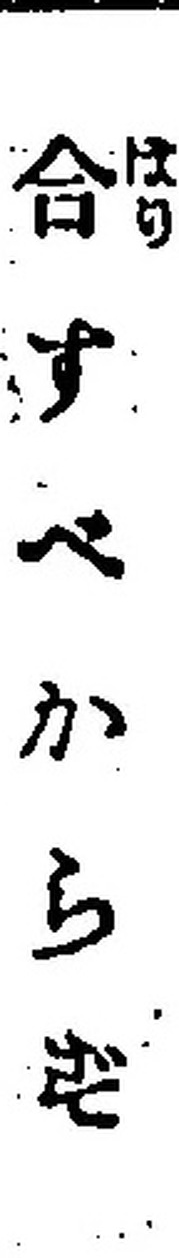合すべからず
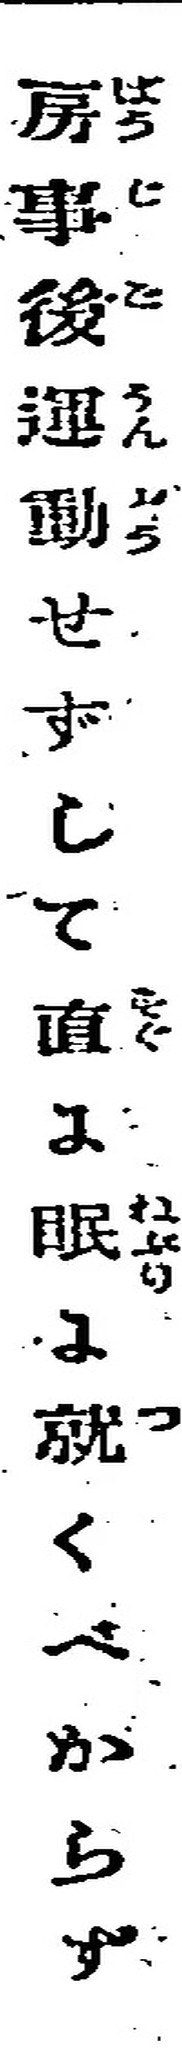房時後運動せずして直んい眠に就くべからず
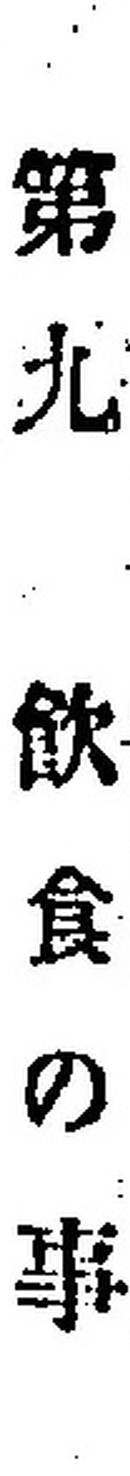第九飲食の事
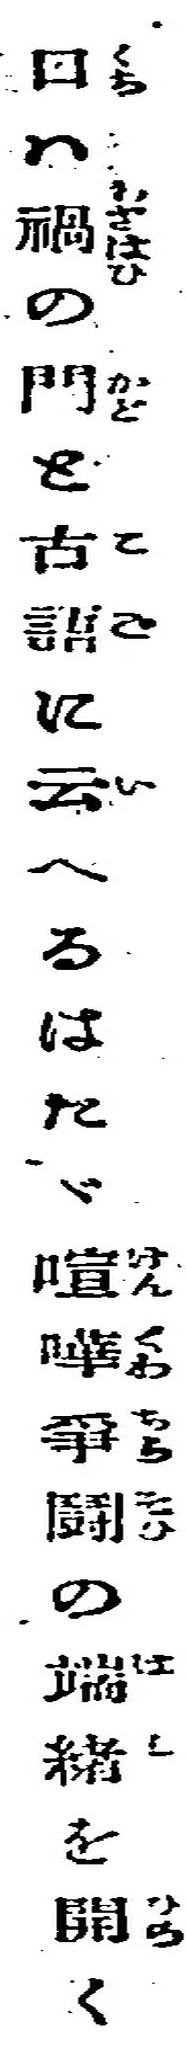口は禍の門と古語に云へるはたゞ喧嘩争闘の端緒を開く
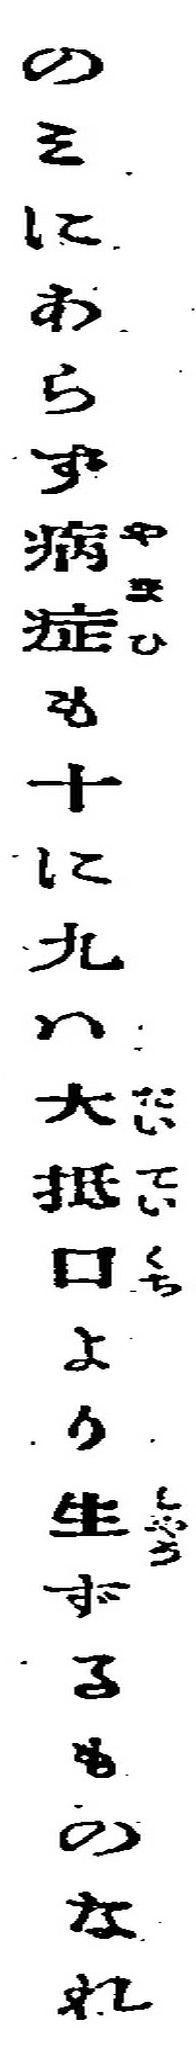のみにあらず病症も十に九は大抵口より生ずるものなれ
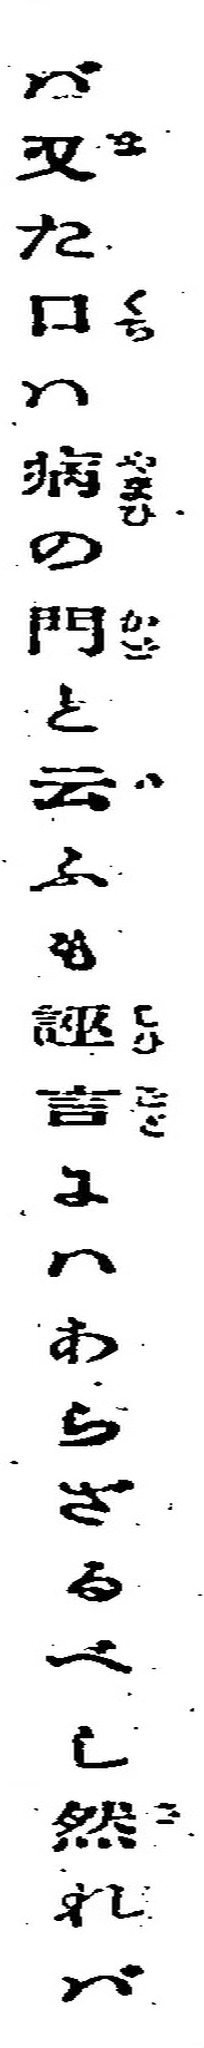ば又た口は病の門と云ふも誣言にはあらざるべし然れば
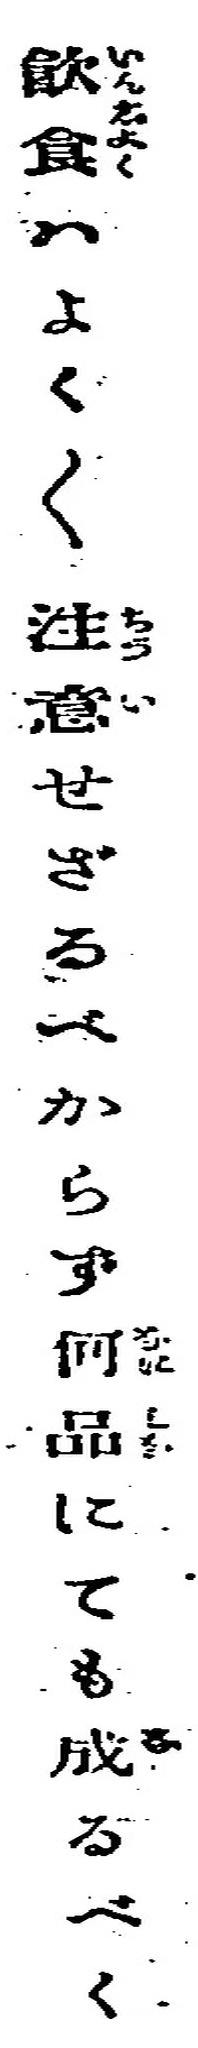飲食はよく〳〵注意せざるべからず何品にても成るべく
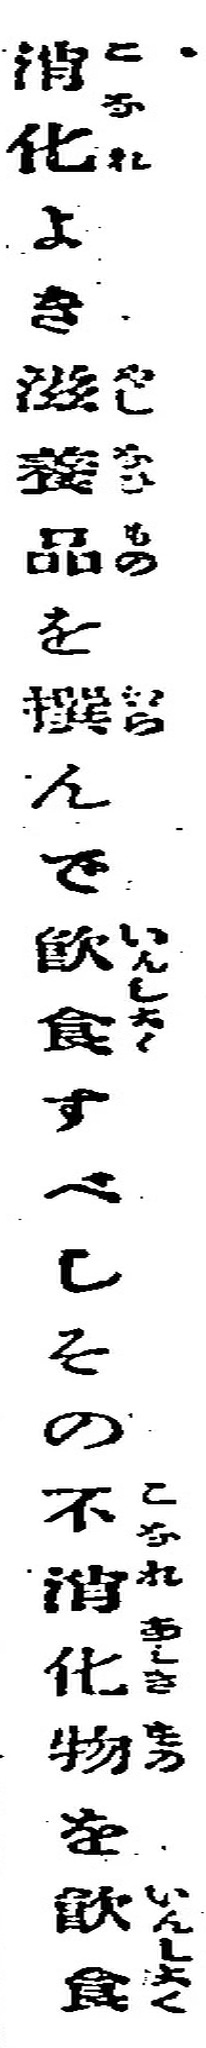消化よき滋養品を撰んで飲食すべしその不消化物を飲食

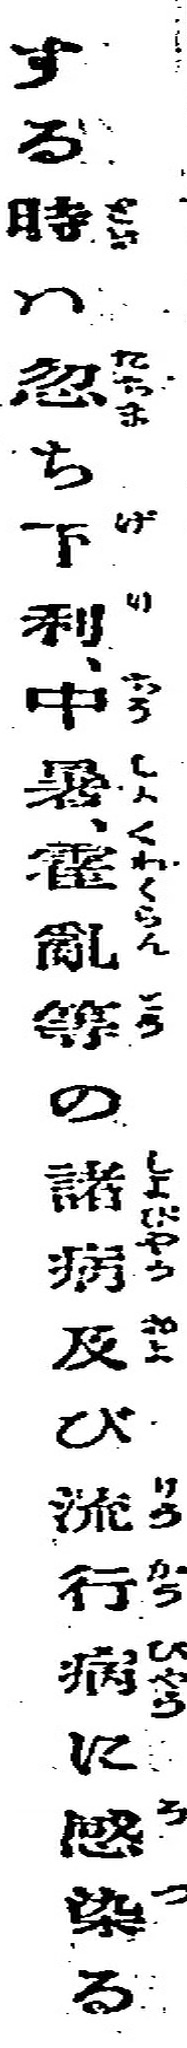する時は忽ち下利、中暑、霍乱等諸病及び流行病に感染る
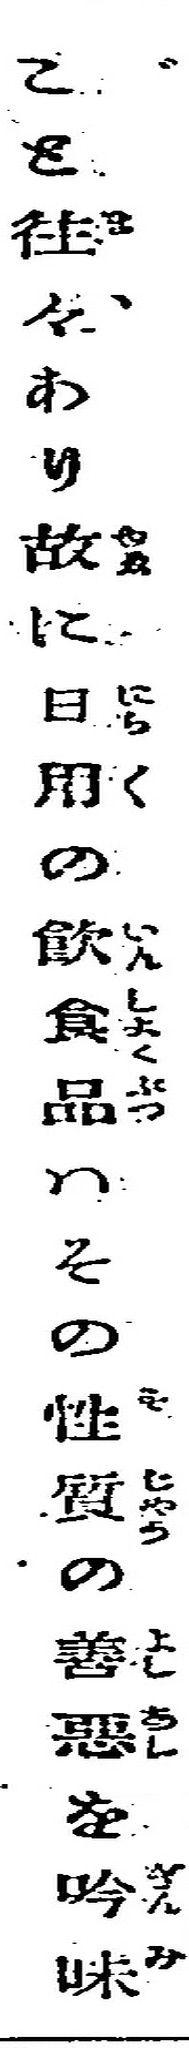こと往々あり故に日用の飲食品はその性質の善悪を吟味
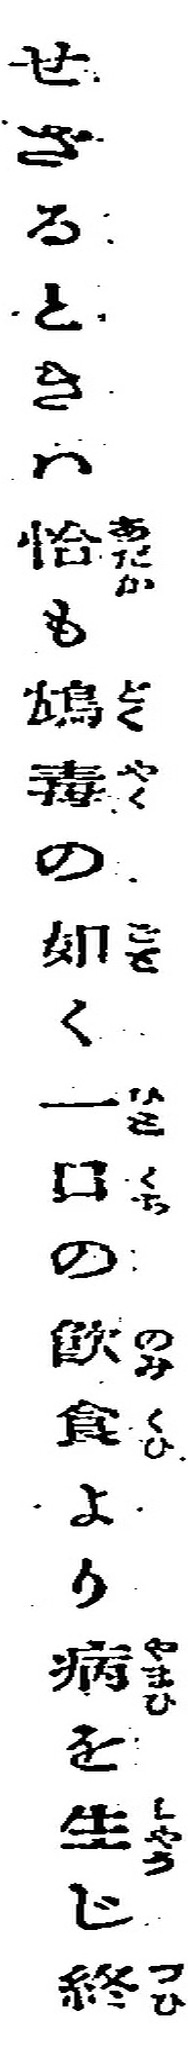せざるときは恰も鴆毒の如く一口の飲食より病を生じ終
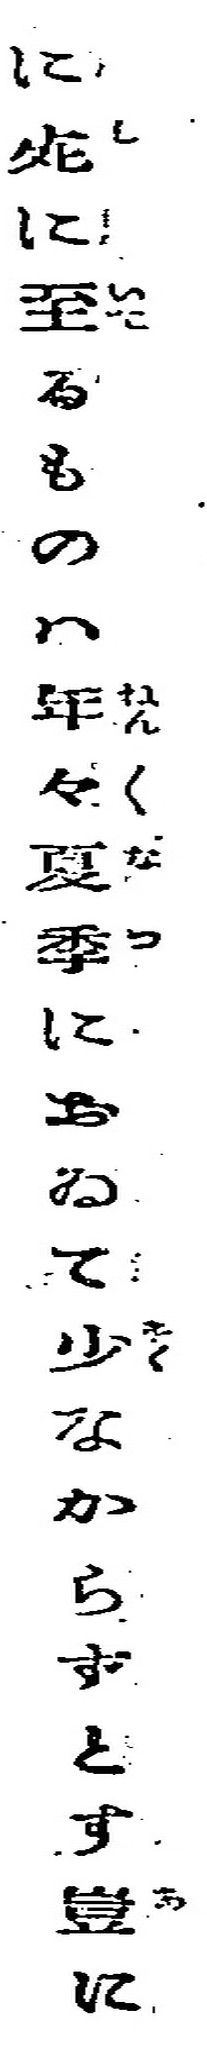に死に至るものは年々夏季におゐて少なからずとす豈に
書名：新撰暑中養生法 : 附・コレラ予防歌
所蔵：国立国会図書館 National Diet Library, JAPAN
